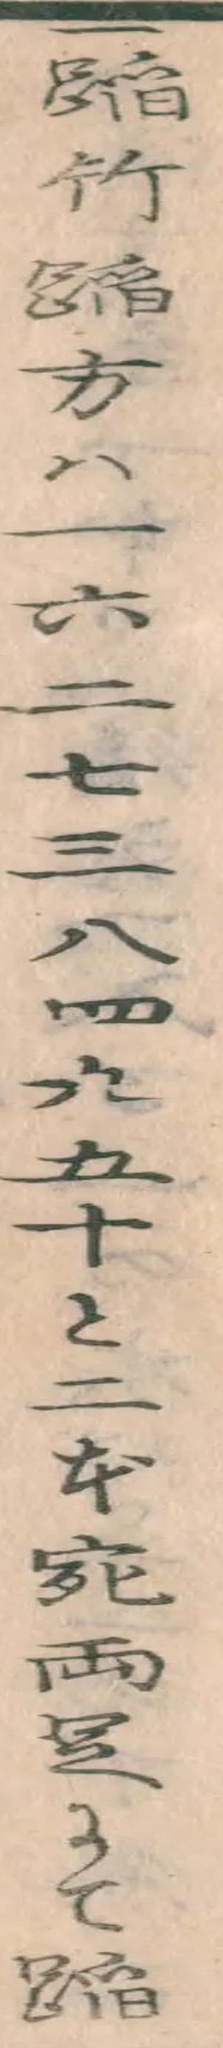一蹈竹蹈方は一六二七三八四九五十と二本宛両足にて蹈
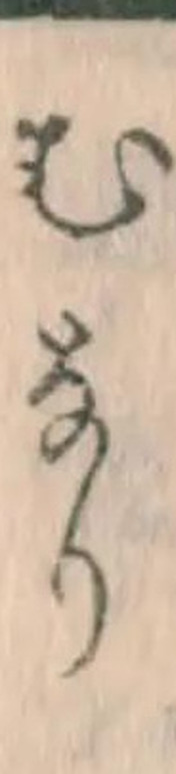むなり
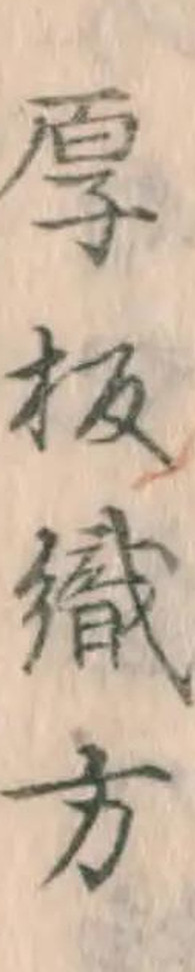厚板織方
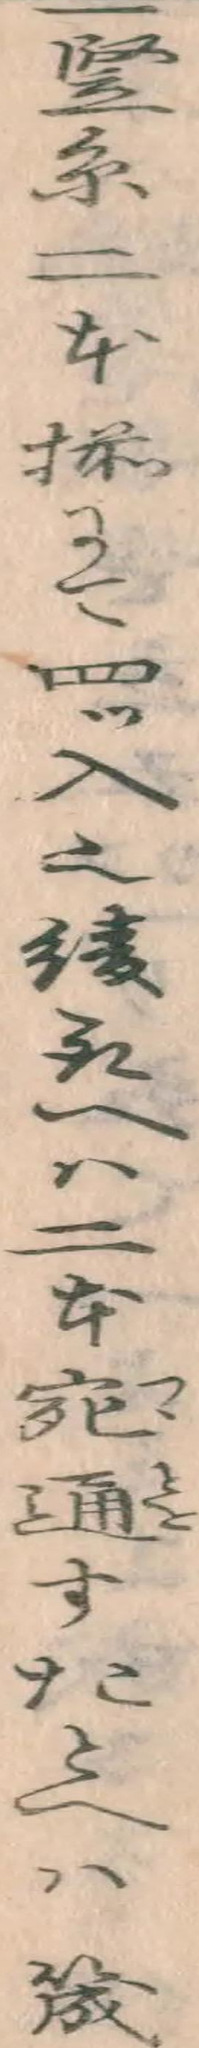一竪糸二本揃にて四ッ入也綾取へは二本宛通すたとへは筬
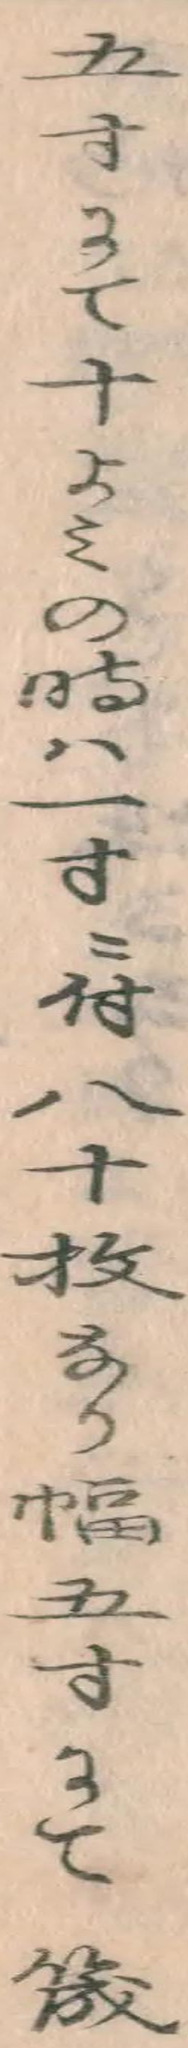五寸にて十よみの時は一寸に付八十枚なり幅五寸にて筬
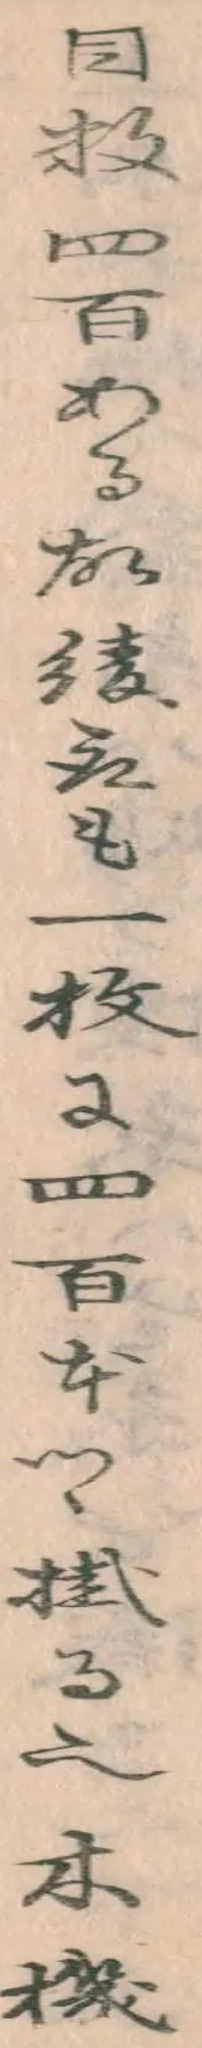目数四百ある故綾取も一枚に四百本つゝ掛る也木機
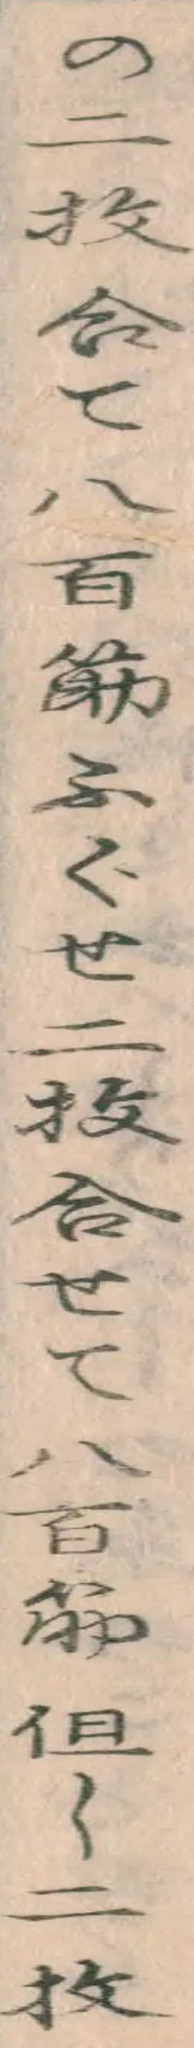の二枚合て八百筋ふぐせ二枚合せて八百筋但し二枚
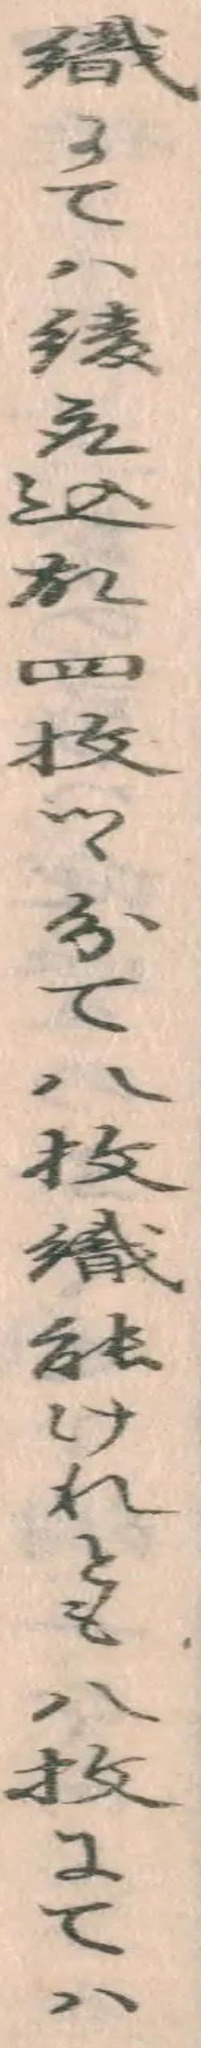織にては綾取込故四枚つゝ分て八枚織能けれとも八枚にては
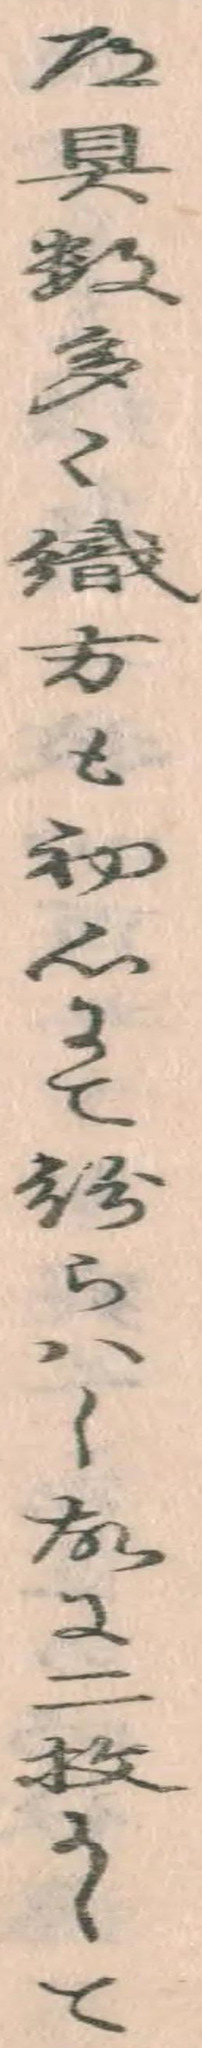道具数多く織方も初心にて紛らはし故に二枚にして
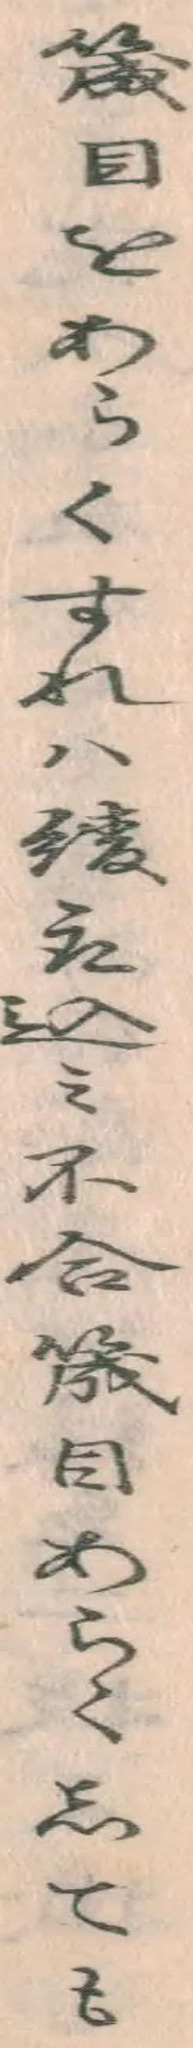筬目をあらくすれは綾取込み不合筬目あらくしても
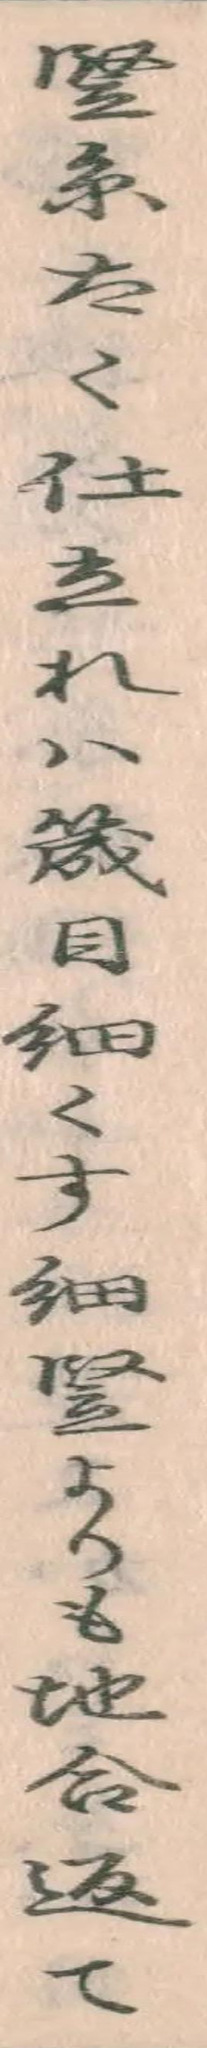竪糸太く仕立れは筬目細くす細竪よりも地合返て
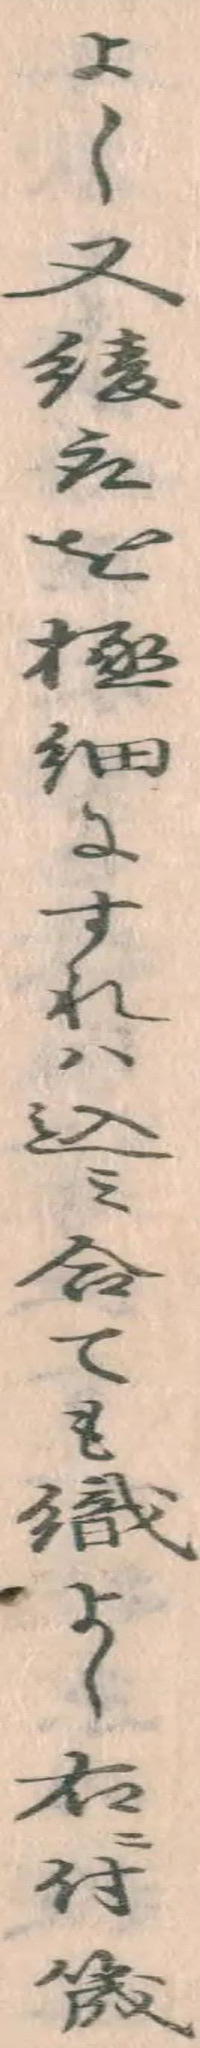よし又綾取を極細にすれは込み合ても織よし右に付筬
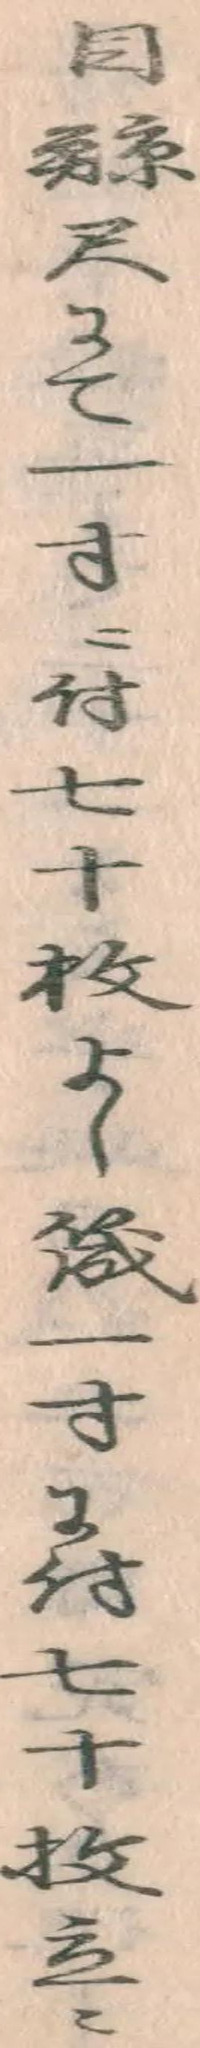目鯨尺にて一寸に付七十枚よし筬一寸に付七十枚立に
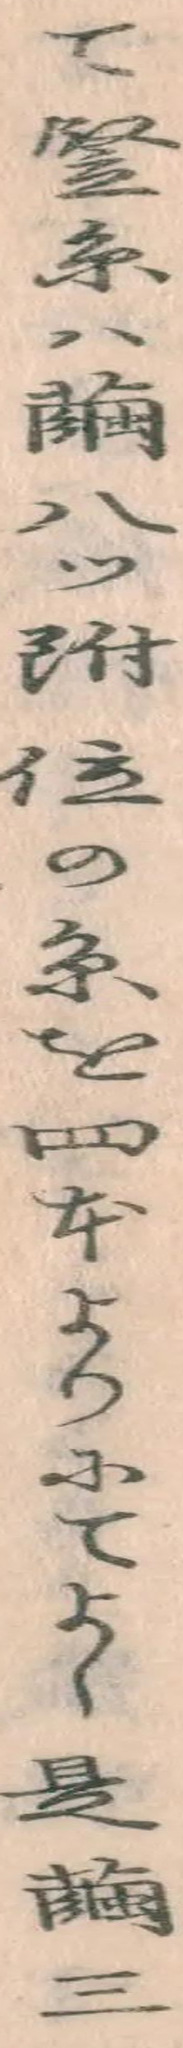て竪糸は繭八ッ附位の糸を四本よりにてよし是繭三
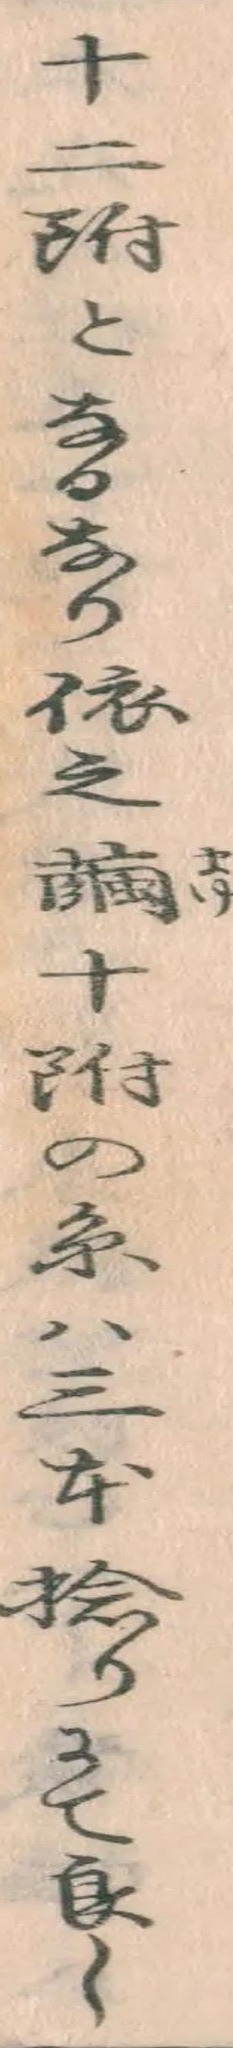十二附となるなり依之繭十附の糸は三本捻りにて良し
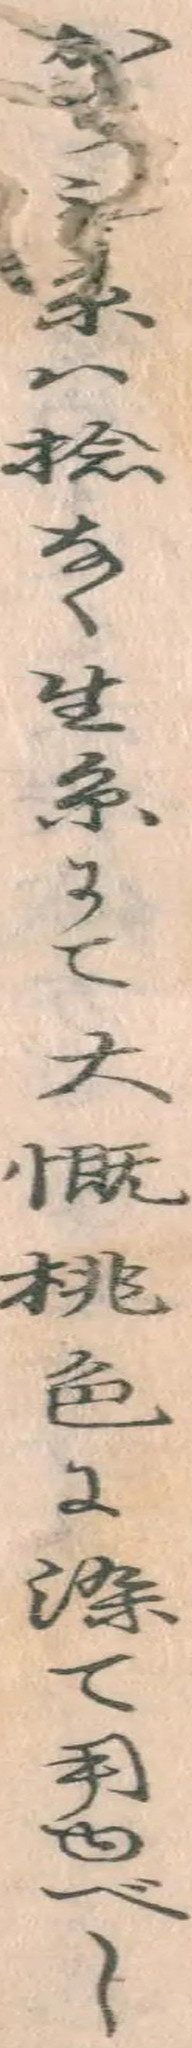からみ糸は捻なく生糸にて大慨桃色に染て用ゆべし
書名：機織彙編 5巻. [2]
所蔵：国立国会図書館 National Diet Library, JAPAN
